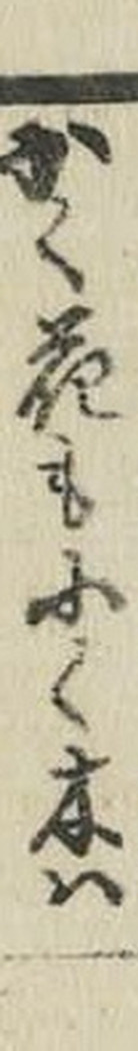かく花も小く木は
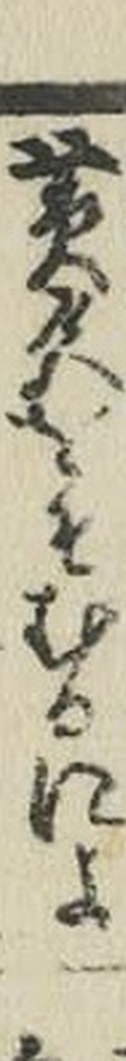黄色をそむるによ
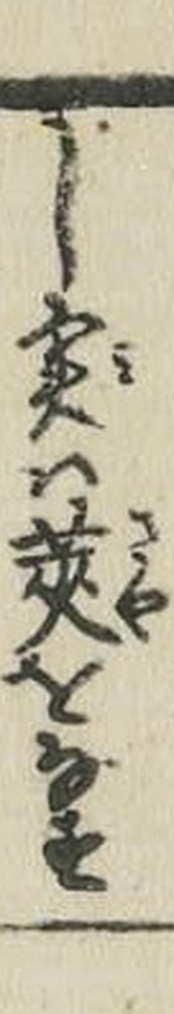し実は莢をなす
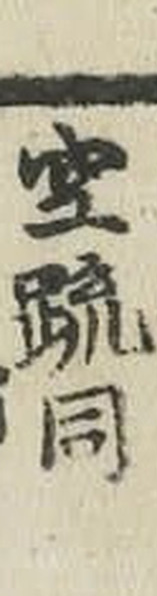空疏同
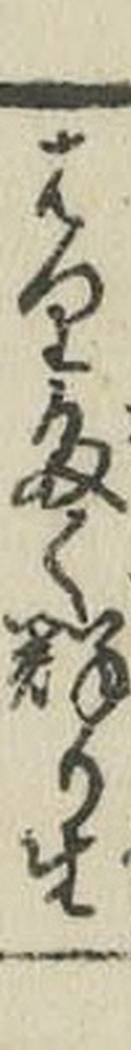はり多く群り生
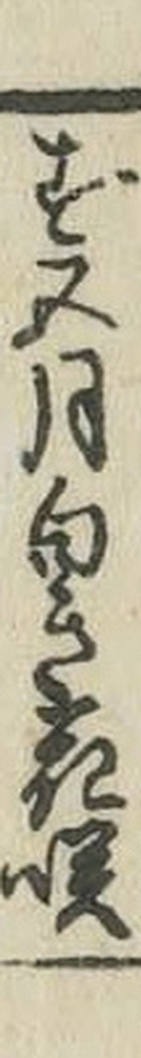ず五月白き花咲
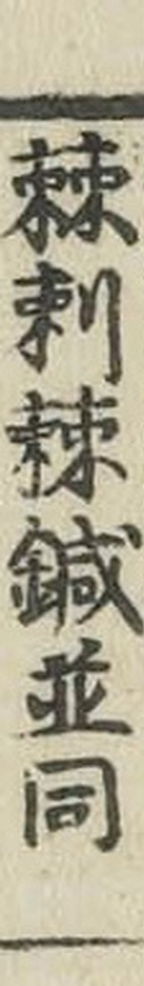棘刺棘鍼並同
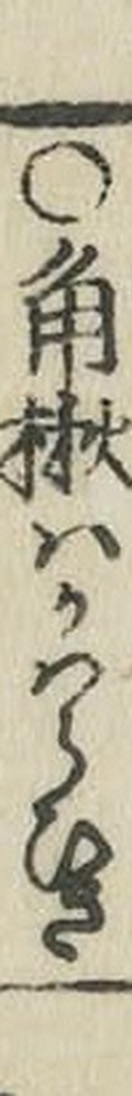○角楸はかはらひさ
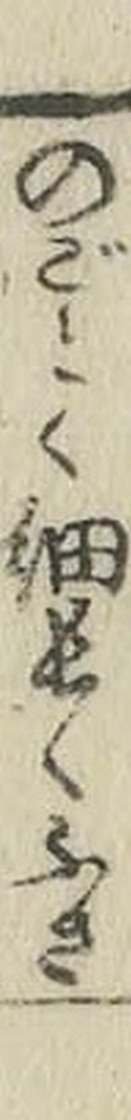のごとく細長くふさ
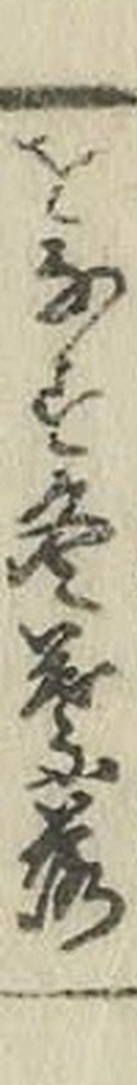をなす冬葉落
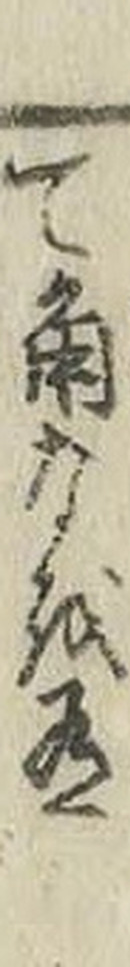て角なお有
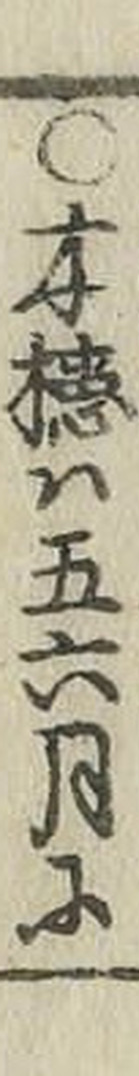○木槵は五六月に
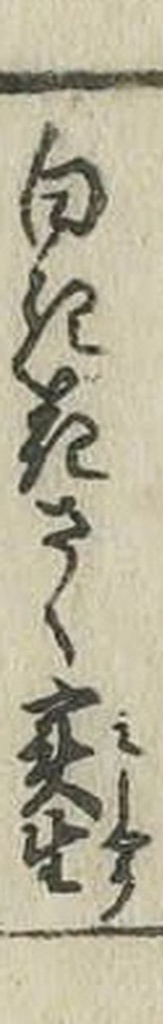白き花さく実生
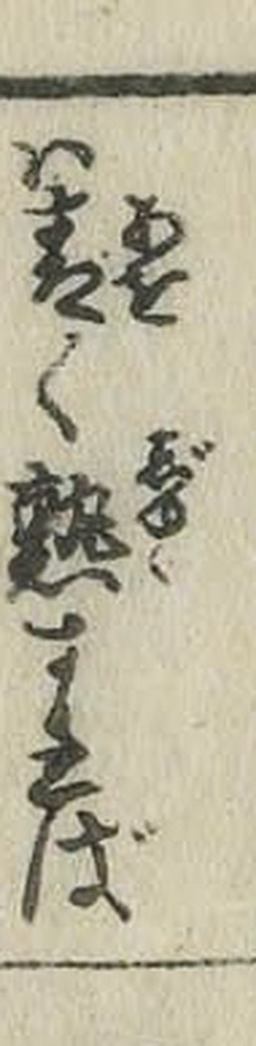は青く熟すれば
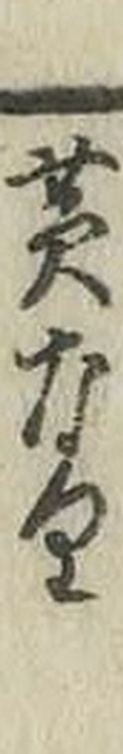黄なり

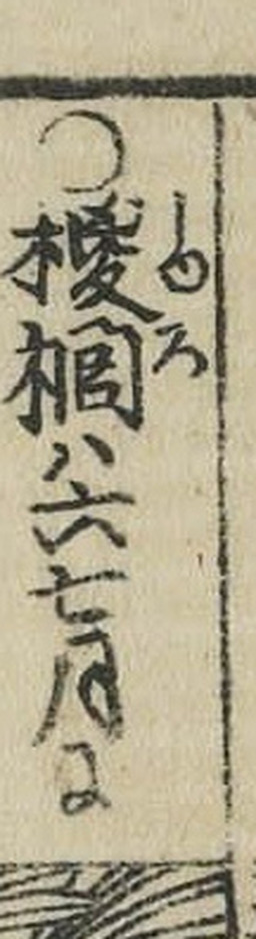○棕櫚は六七月に
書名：増補頭書訓蒙図彙大成 10巻 8:巻之17-19
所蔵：東京学芸大学教育コンテンツアーカイブ
